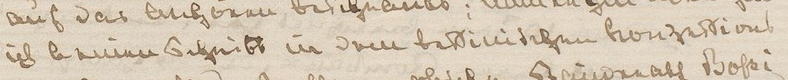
ich keinen Schritt in dem tessinischen Konzessions-
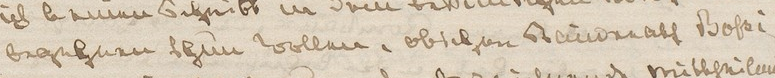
begehren thun wollen, obschon Ständerath Bossi
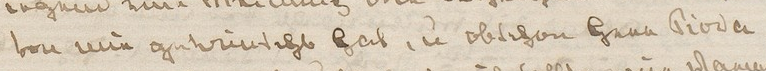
von mir gewünscht hat, u obschon Herr Pioda
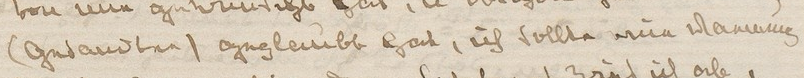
(Gesandter) geglaubt hat, ich sollte eine Warnung
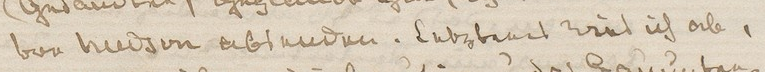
vor Hudson absenden. Letzteres wies ich ab,
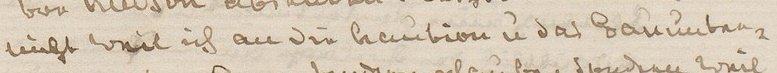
nicht weil ich an die Kaution u das Bauunter-
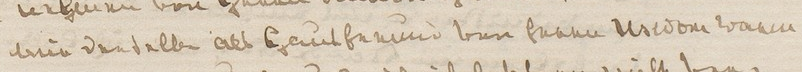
mir derselbe als Hausfreund von Herrn Usedom warm
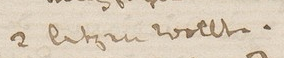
letzen wollte.
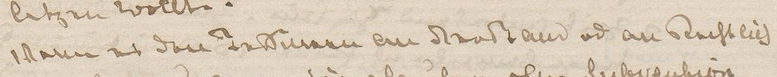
Wenn es den Tessinern an Verstand od an Rechtlich-
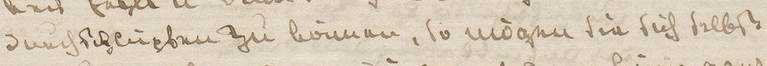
durchschlüpfen zu können, so mögen sie sich selbst
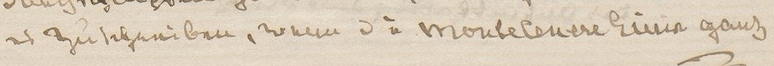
es zuschreiben, wenn die Monte Cenere Linie ganz
